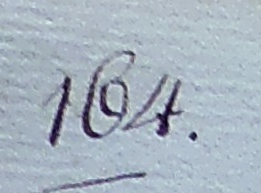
164.
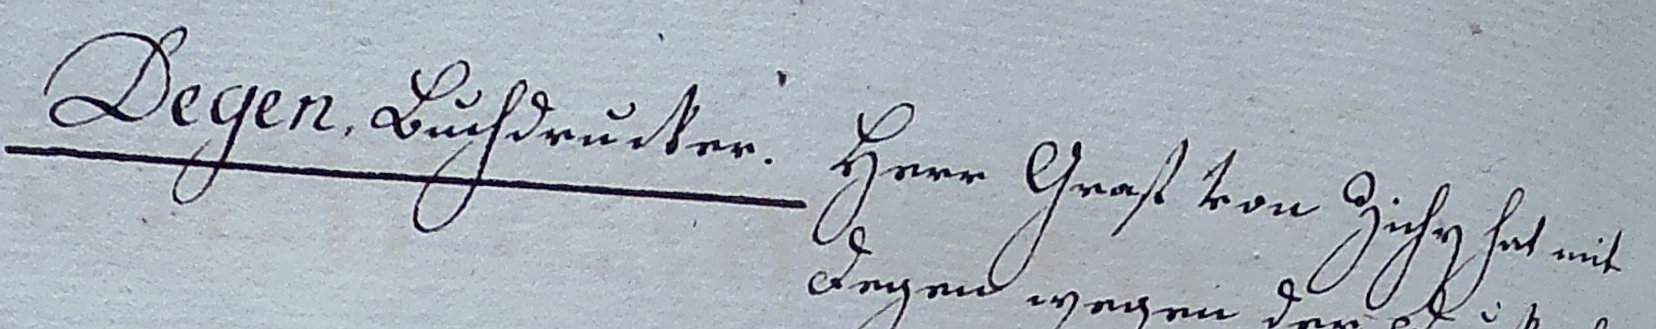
Degen, Buchdrucker. Herr Graf von Zichy hat mit
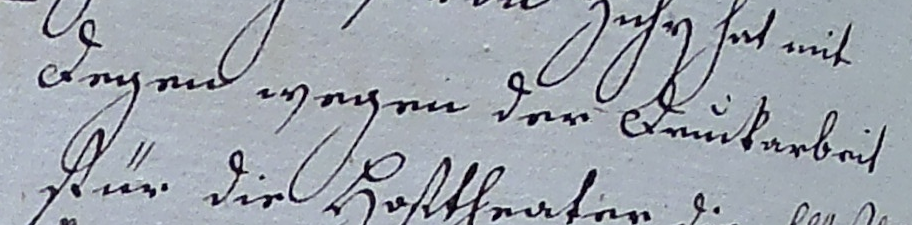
Degen wegen der Druckarbeit
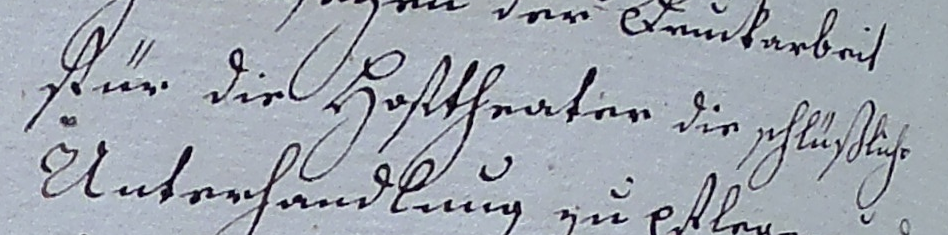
für die Hoftheater die schriftliche
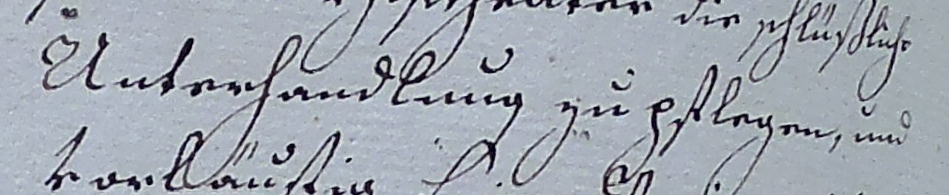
Unterhandlung zu pflegen, und
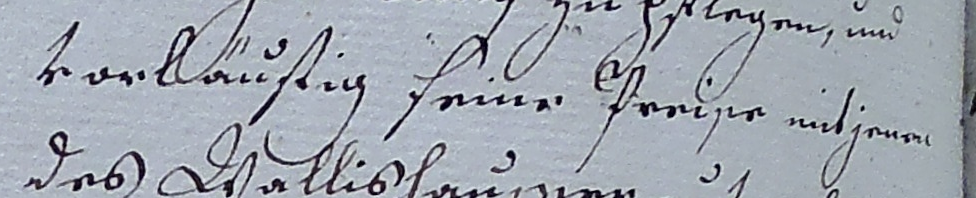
vorläufig seine Preise mit jenen
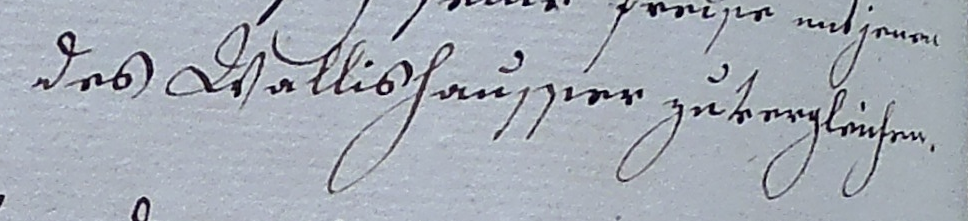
des Wallishausser zuvergleichen.
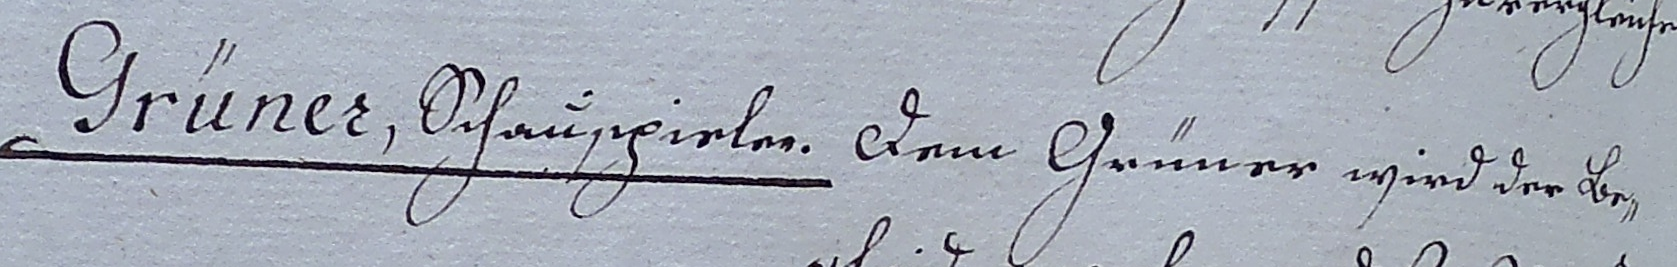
Grüner, Schauspieler. Dem Grüner wird der Be¬
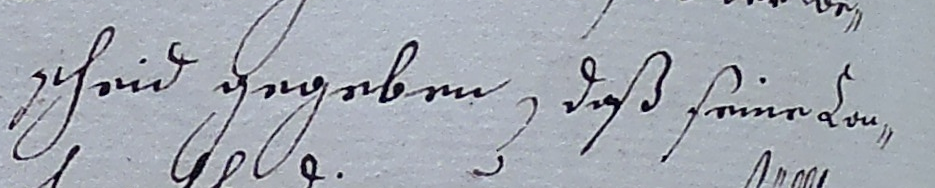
scheid gegeben, daß seine Con¬
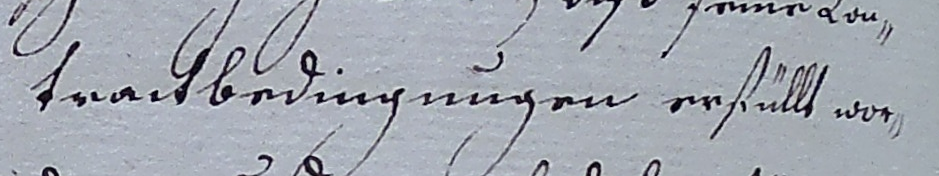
tractbedingungen erfüllt wor¬
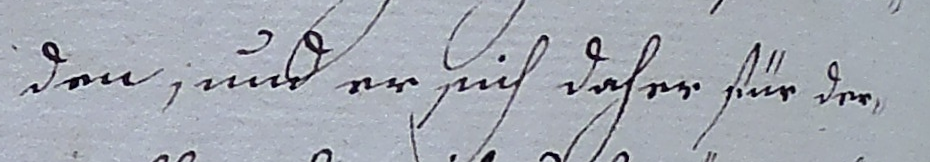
den, und er sich daher für der
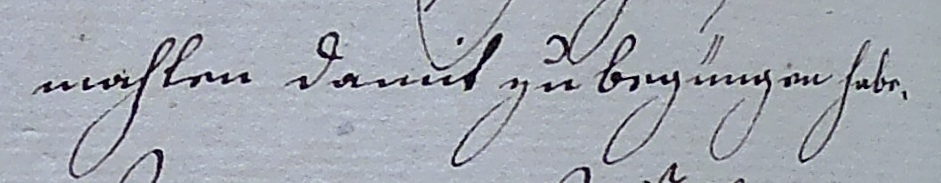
mahlen damit zu begnügen habe.
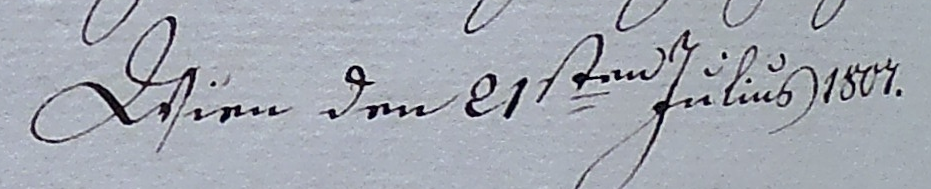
Wien den 21ste͇n Julius 1807.
